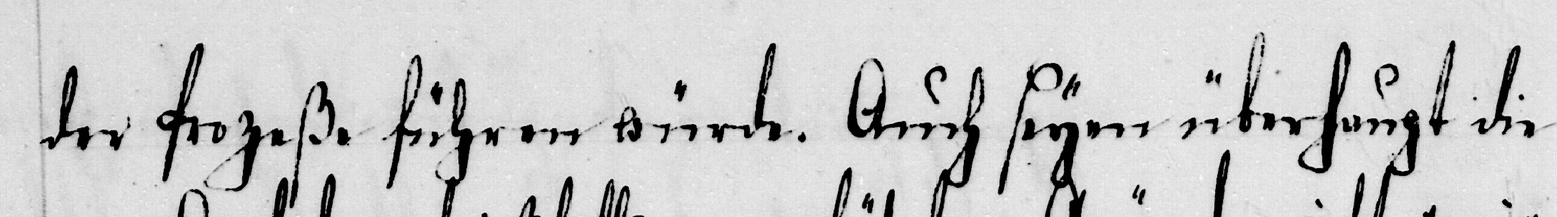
der Prozeße führen würde. Auch seyen überhaupt die
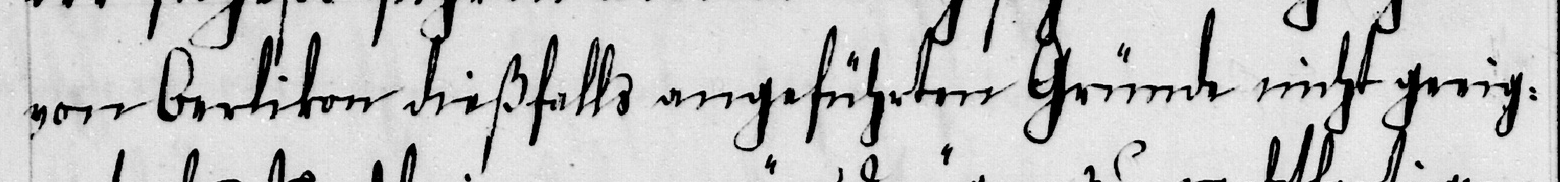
von Oerlikon dießfalls angeführten Gründe nicht geeig¬
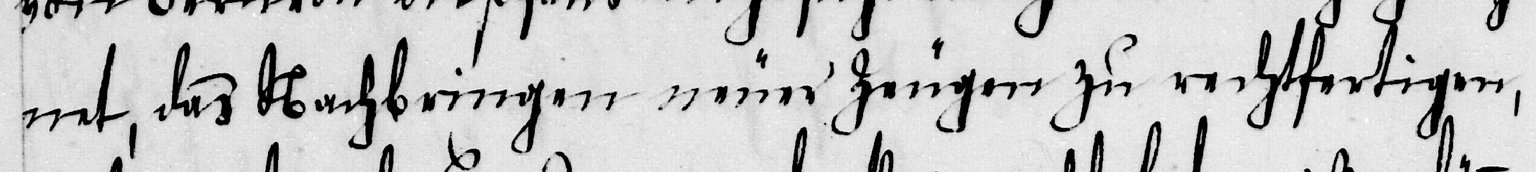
net, das Nachbringen neuer Zeugen zu rechtfertigen,
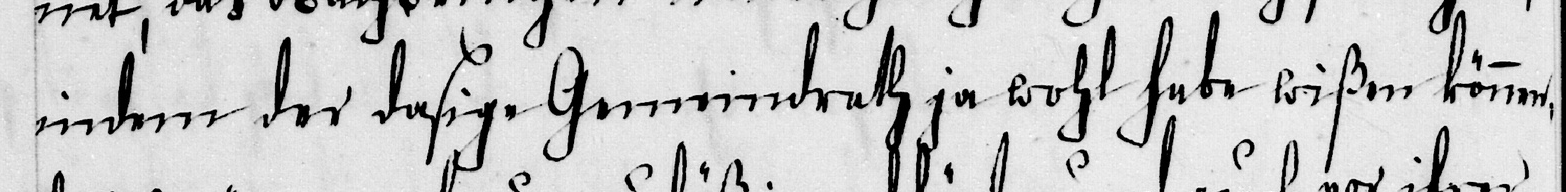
indem der dasige Gemeindrath ja wohl habe wißen kön¬
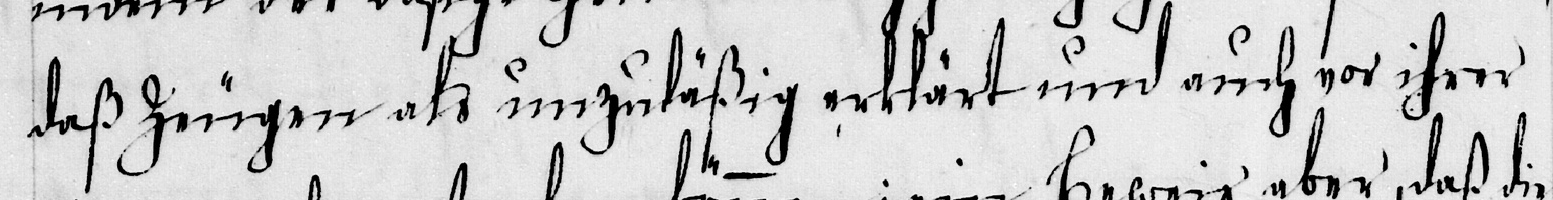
daß Zeugen als unzuläßig erklärt und auch vor ihrer
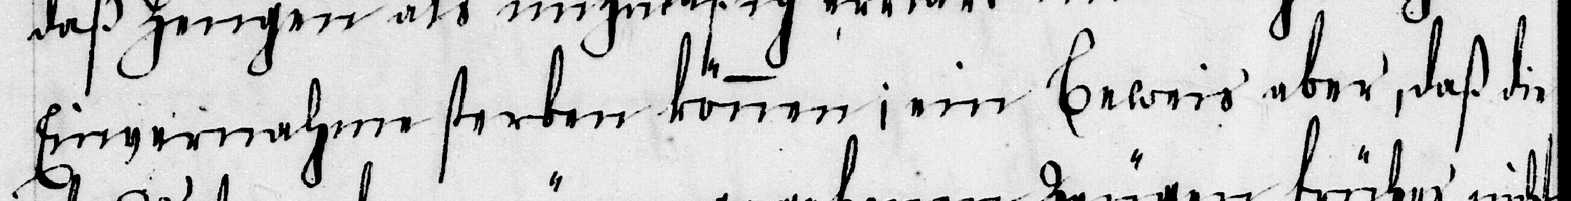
Einvernahme sterben können; ein Beweis aber, daß die
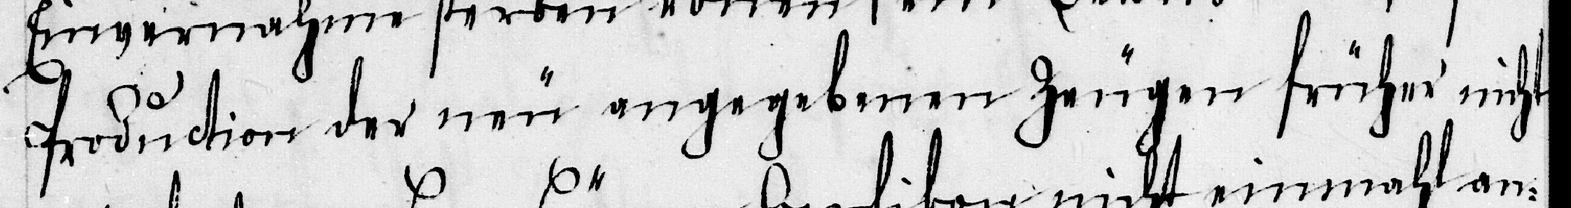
Production der neu angegebenen Zeugen früher nicht
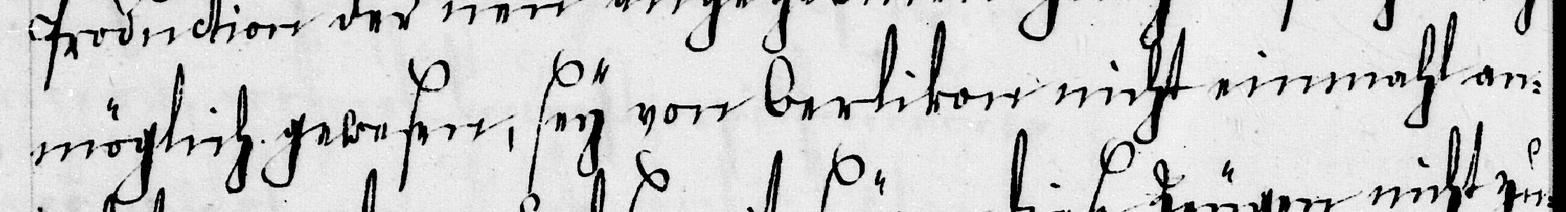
möglich gewesen, sey von Oerlikon nicht einmahl an¬
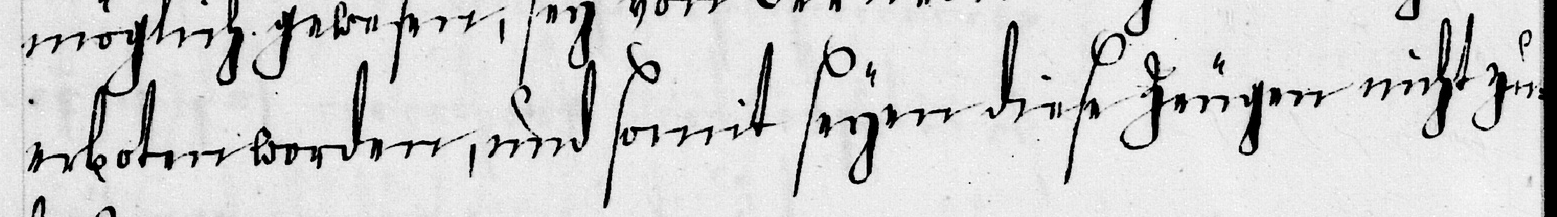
erboten worden, und somit seyen diese Zeugen nicht z¬
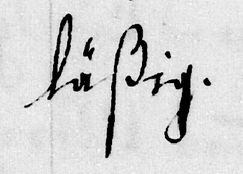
uläßig.
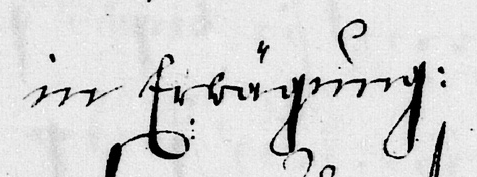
in Erwägung:
